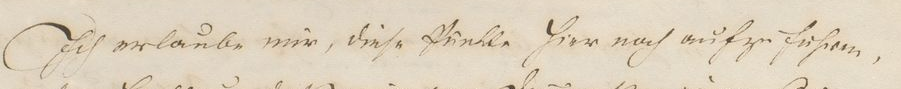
Ich erlaube mir, diese Punkte hier noch aufzuführen,
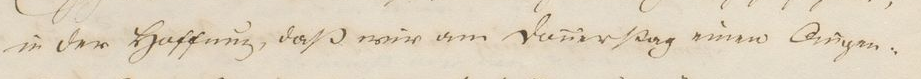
in der Hoffnung, daß wir am Donnerstag einen Augen-
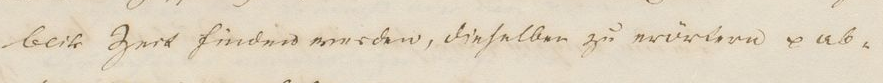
blik Zeit finden werden, dieselben zu erörtern & ab-
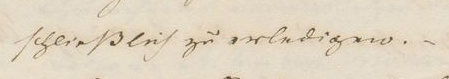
schließlich zu erledigen. –
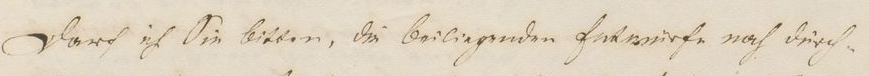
Darf ich Sie bitten, die beiliegenden Entwürfe noch durch-
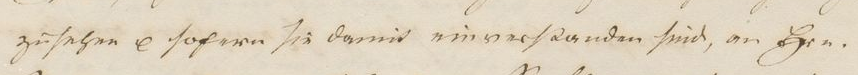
zusehen & sofern sie damit einverstanden sind, an Hrn.
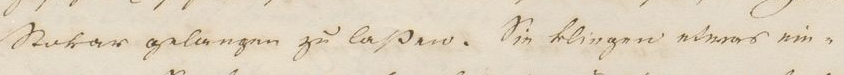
Stokar gelangen zu laßen. Sie klingen etwas ein-
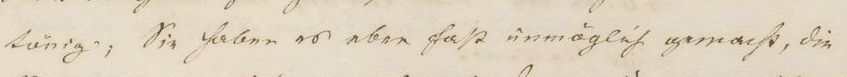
tönig; Sie haben es aber fast unmöglich gemacht, die
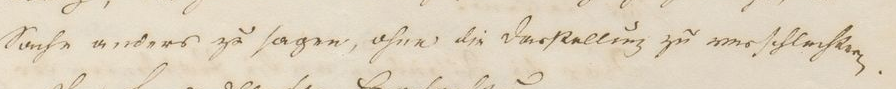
Sache anders zu sagen, ohne die Darstellung zu verschlechtern.
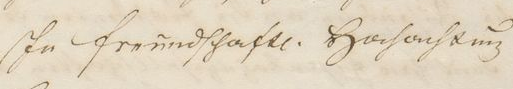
In freundschaftl. Hochachtung
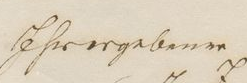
Ihr ergebener
